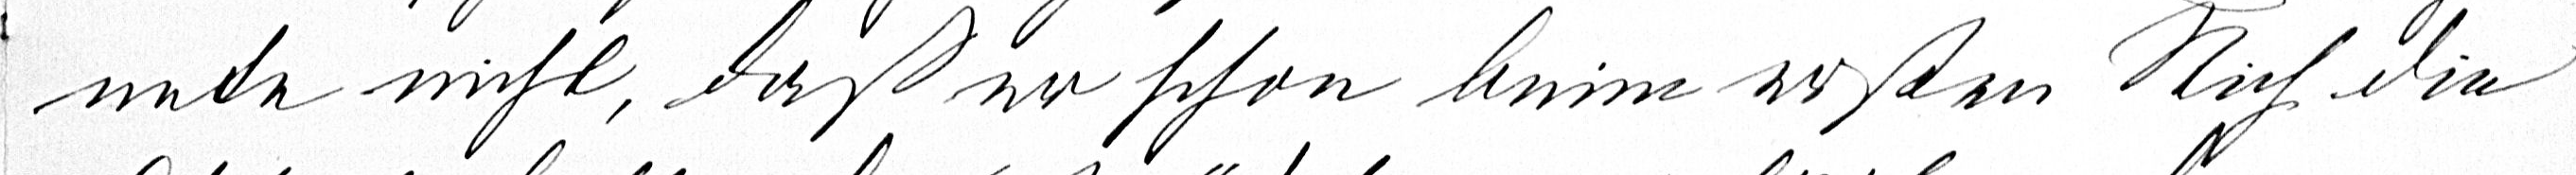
nete nicht, daß er schon beim ersten Nich die
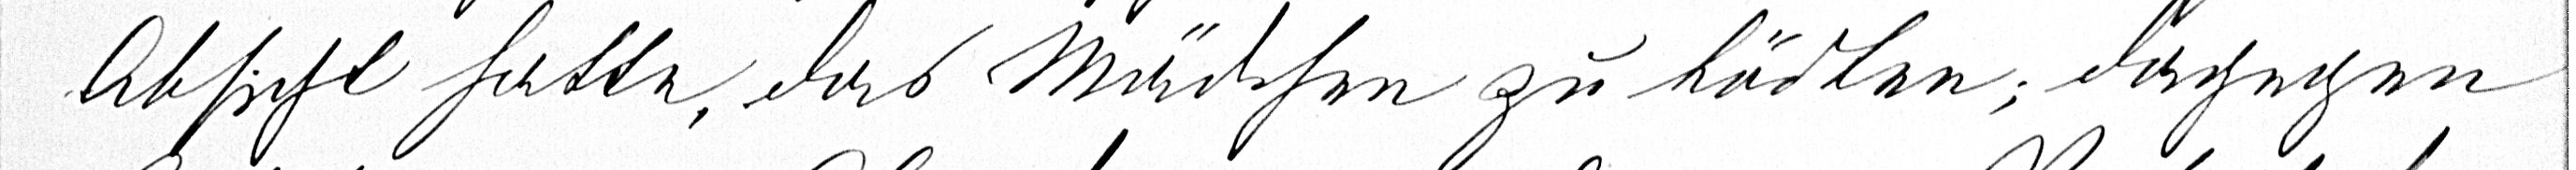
Absicht hatte, das Mädchen zu tödten; dagegen
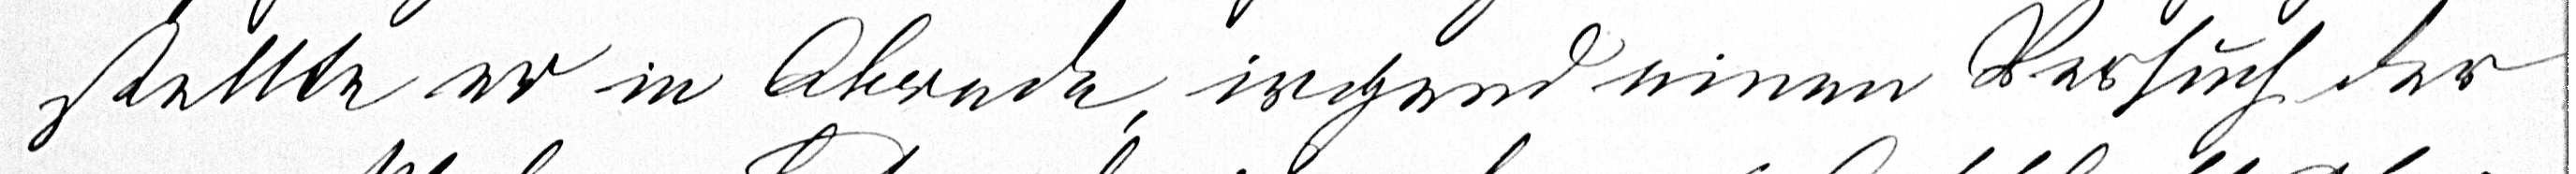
stellte er in Abrede, irgend einen Versuch der
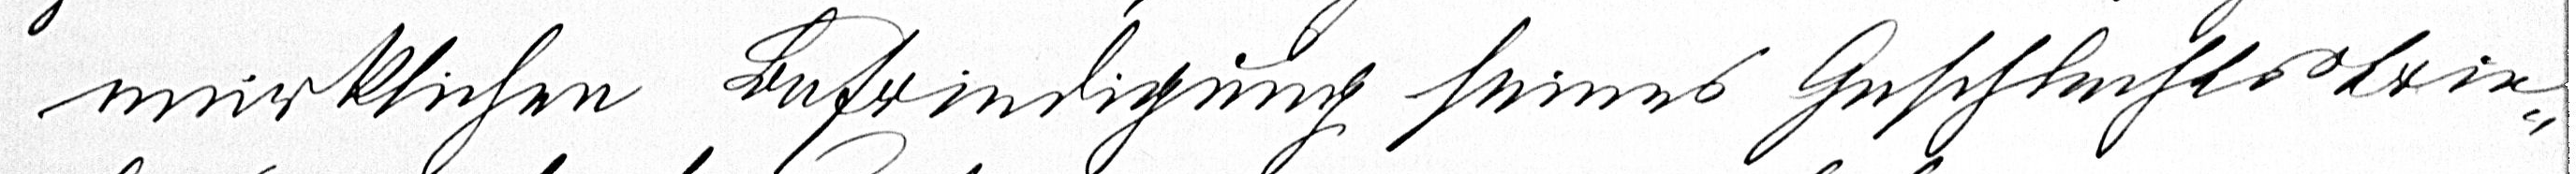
wirklichen Befriedigung seines Geschlechtstrie¬
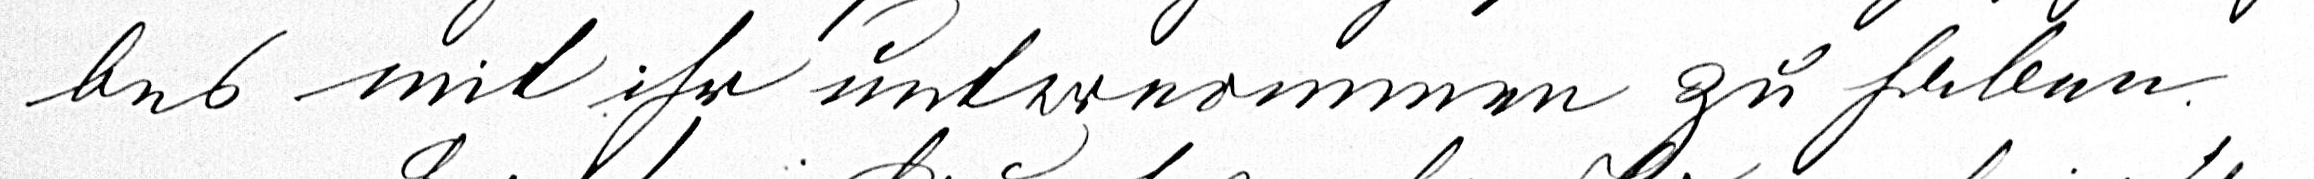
bes mit ihr unternommen zu haben.
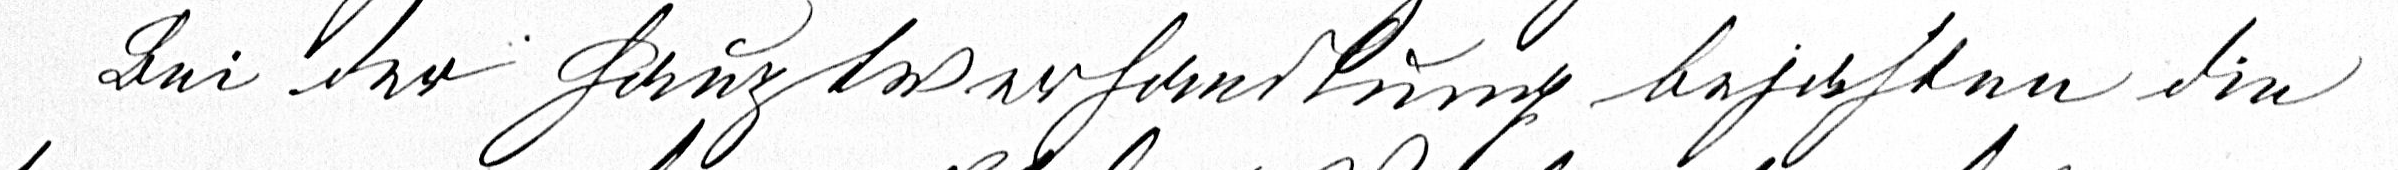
Bei der Hauptverhandlung bejahten die
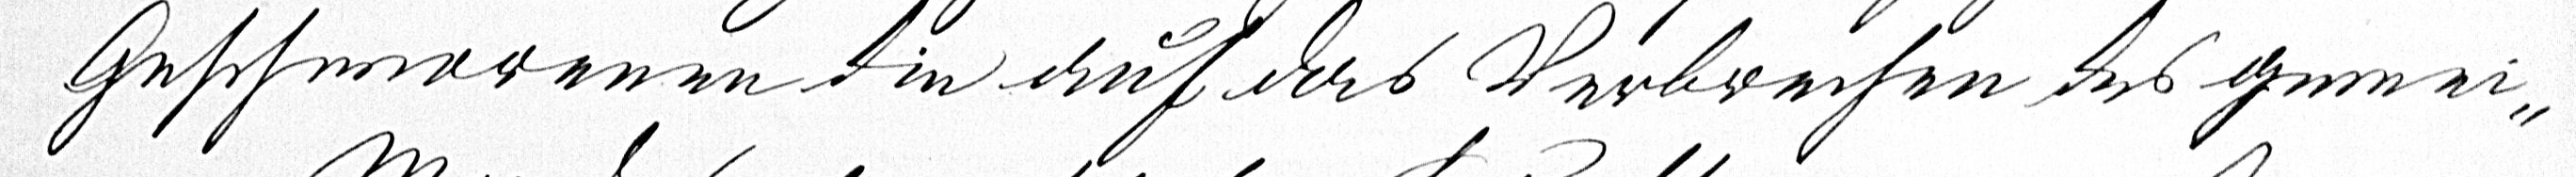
Geschworenen die auf das Verbrechen des gemei¬
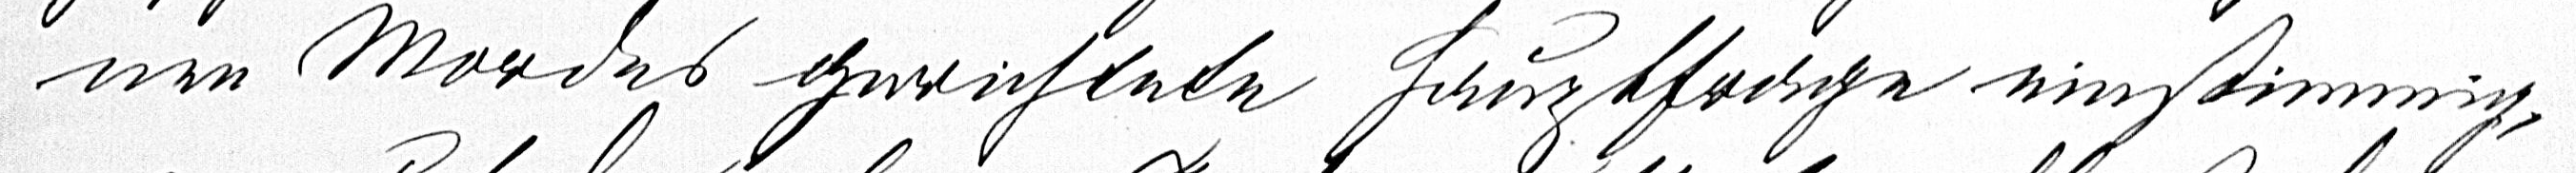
nen Mordes gerichtete Hauptfrage einstimmig,
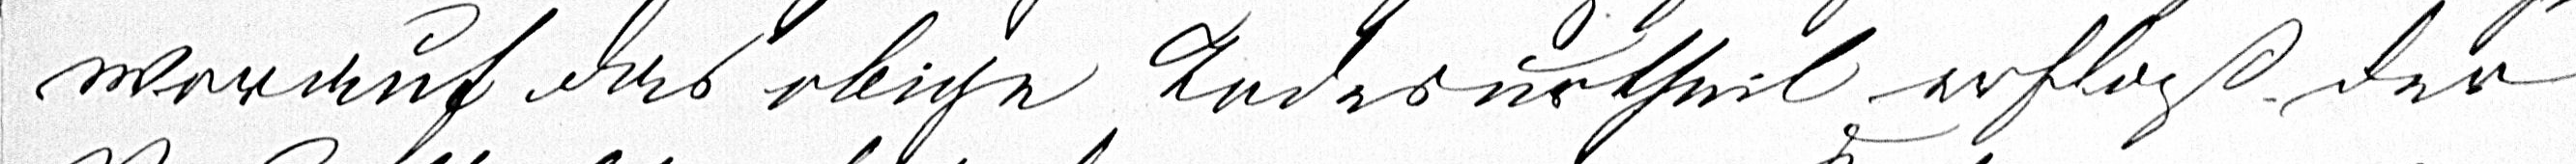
worauf das obige Todesurtheil erfloß der
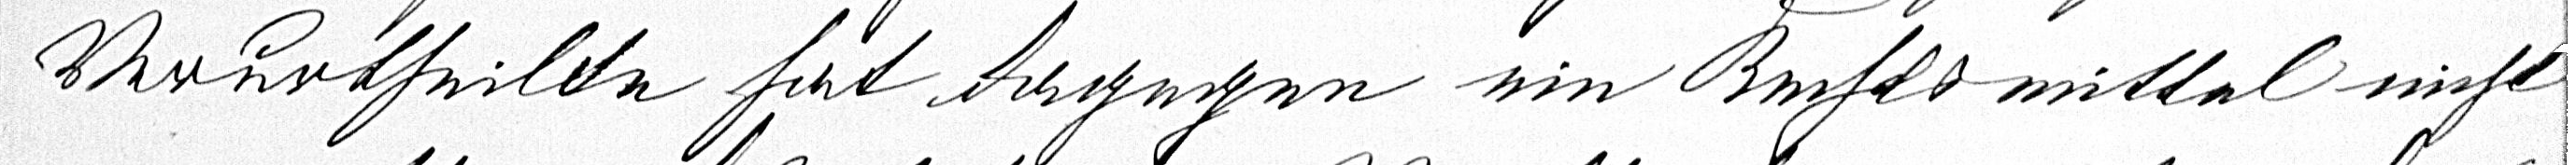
Verurtheilte hat dagegen ein Rechtsmittel nicht
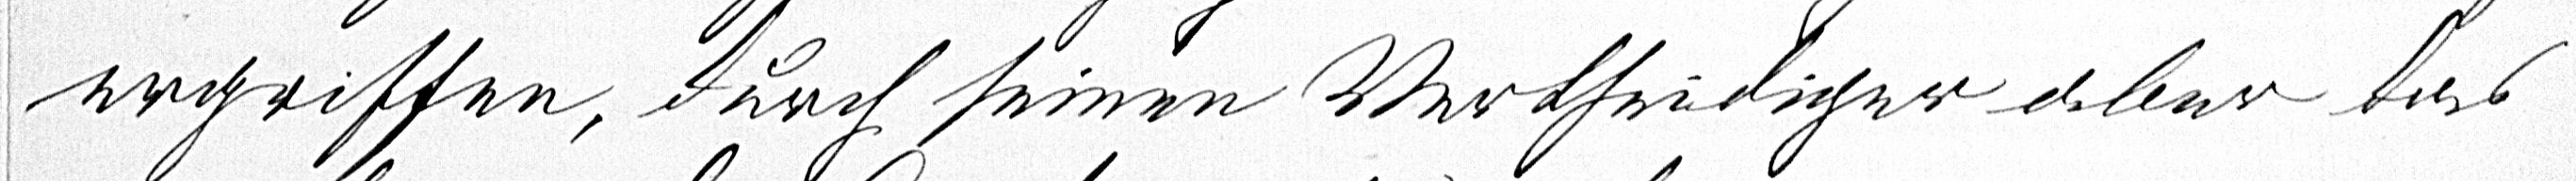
ergriffen, durch seinen Vertheidiger aber das
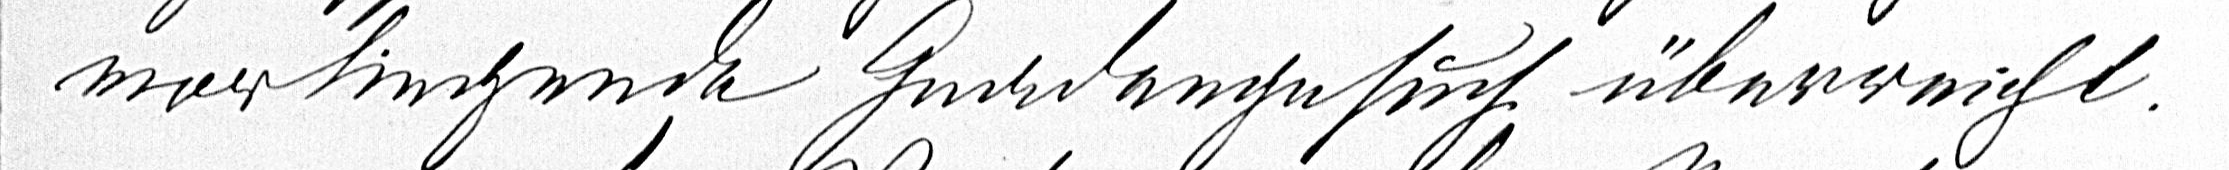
vorliegende Gnadengesuch überreicht.
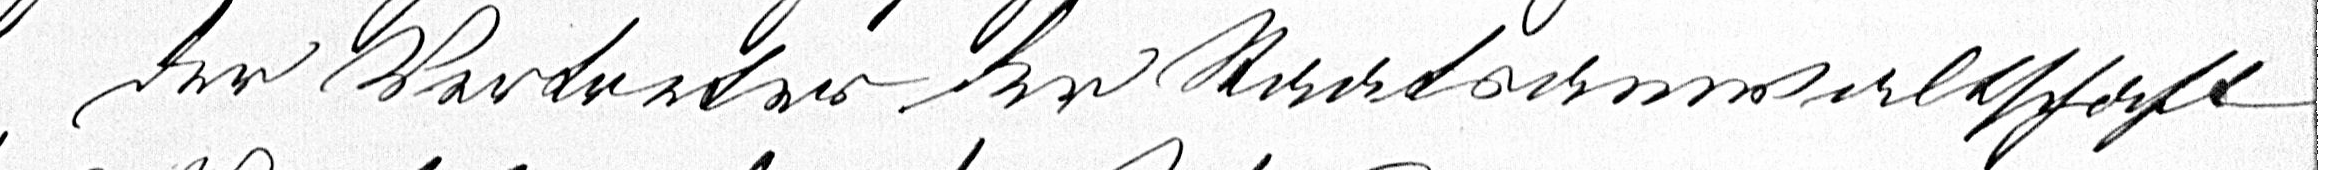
Der Vertreter der Staatsanwaltschaft
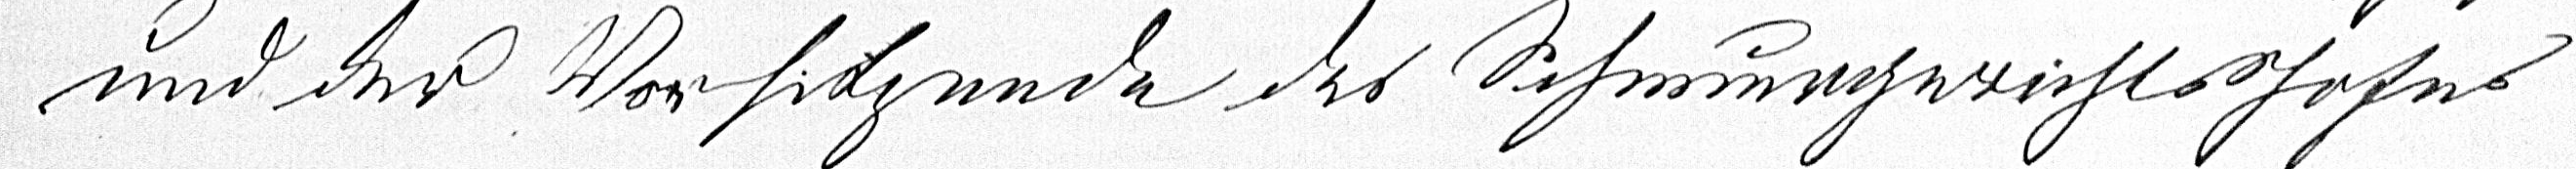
und der Vorsitzende des Schwurgerichtshofes
